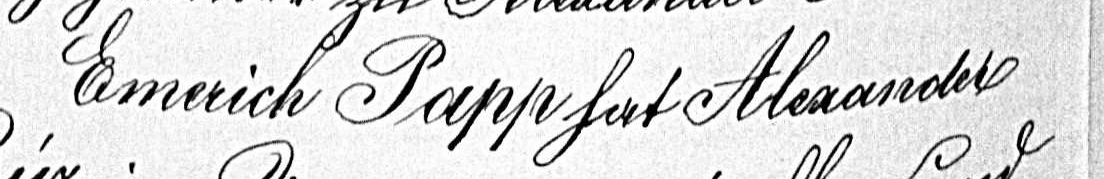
Emerich Papp hat Alexander
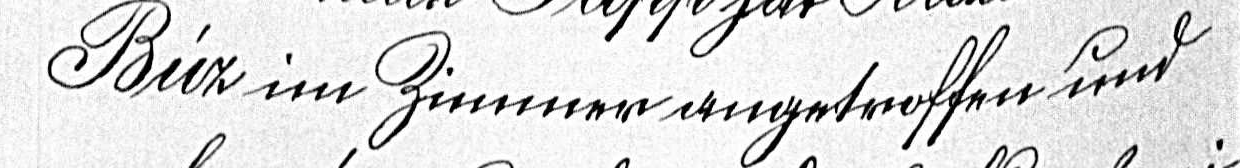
Búz im Zimmer angetroffen und
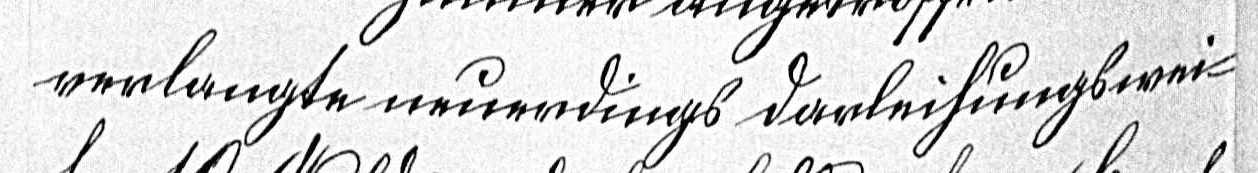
verlangte neuerdings darleihungswei¬
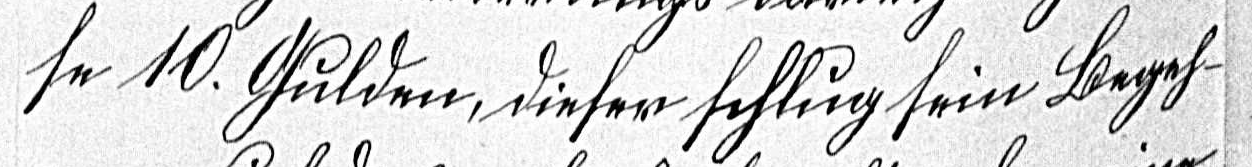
se 10. Gulden, dieser schlug sein Begeh¬
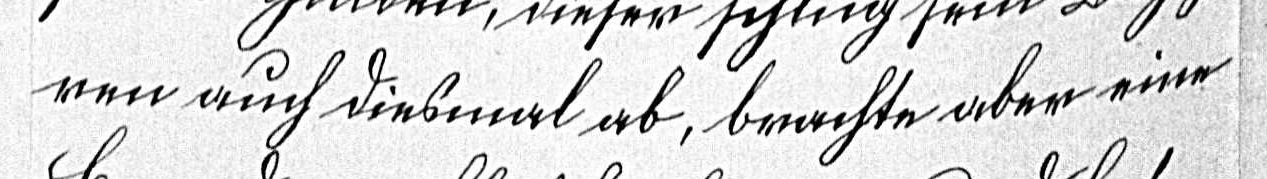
ren auch diesmal ab, brachte aber eine
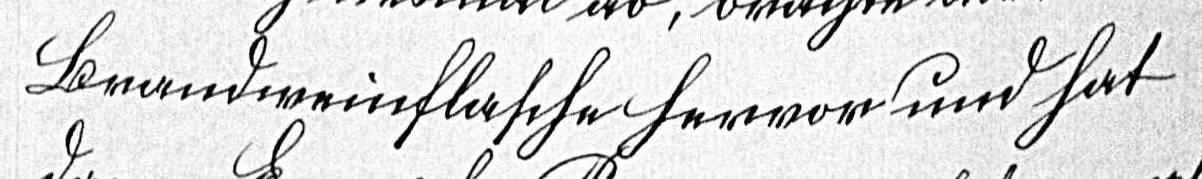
Brandweinflasche hervor und hat
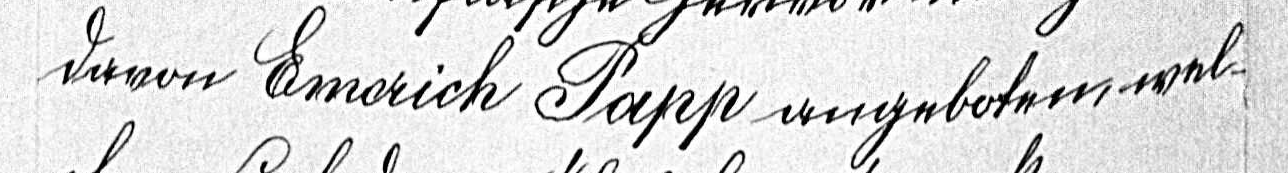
davon Emerich Papp angeboten, wel¬
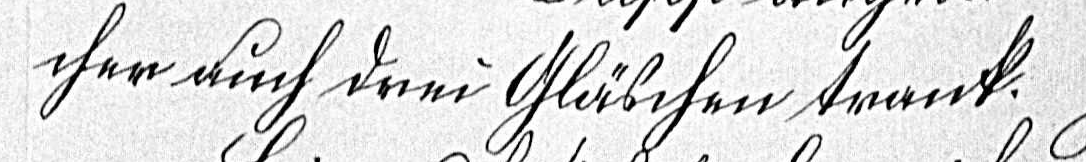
cher auch drei Gläschen trank.
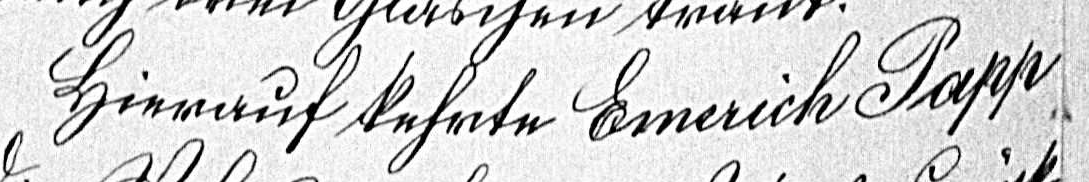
Hierauf kehrte Emerich Papp
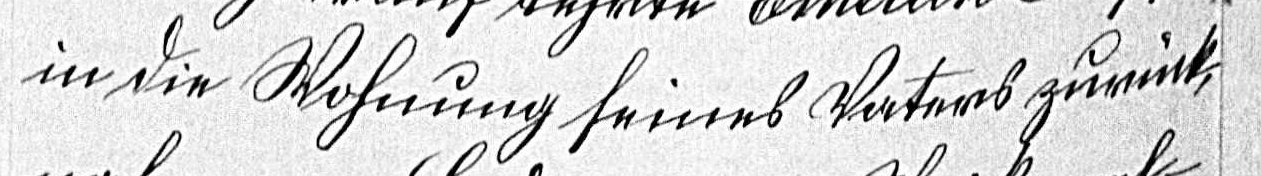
in die Wohnung seines Vaters zurück,
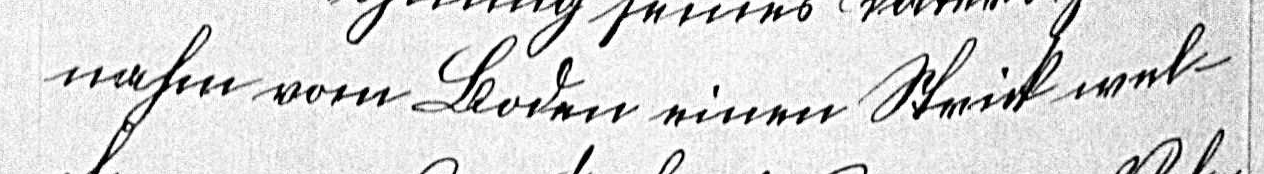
nahm vom Boden einen Strick
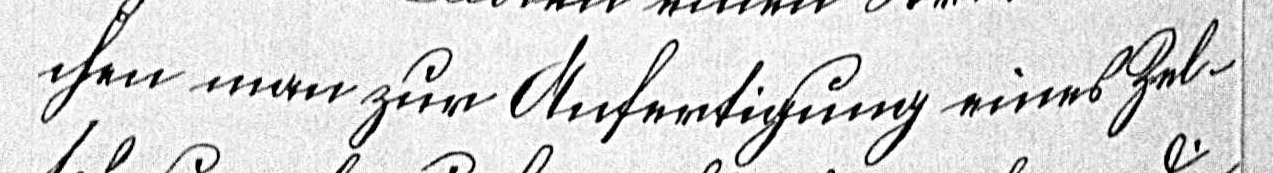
man zur Anfertigung eines Zel¬
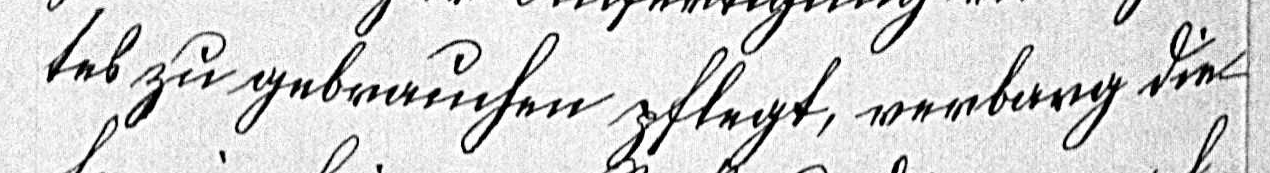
tes zu gebrauchen pflegt, verbarg die¬
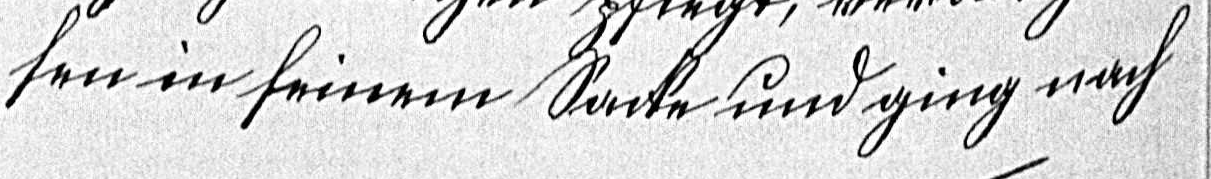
sen in seinem Sacke und ging nach
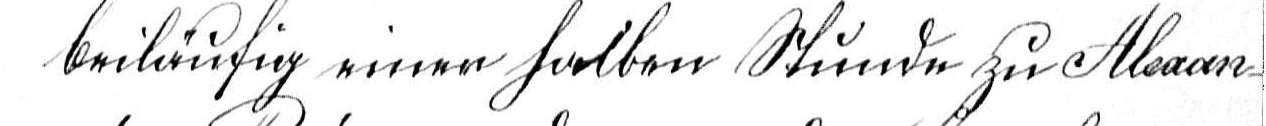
beiläufig einer halben Stunde zu Alexan¬
